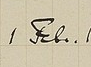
1. Febr.
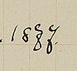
1877.
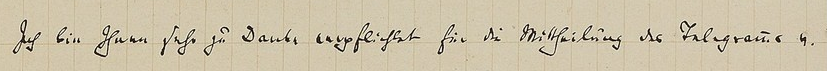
Ich bin Ihnen sehr zu Danke verpflichtet für die Mittheilung des Telegramms v.
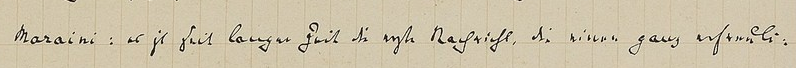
Maraini: es ist seit langer Zeit die erste Nachricht, die einen ganz erfreuli-
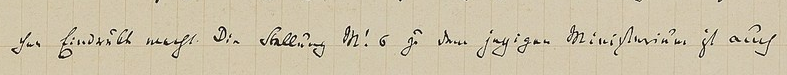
chen Eindrukk macht. Die Stellung M.'s zu dem jezigen Ministerium ist auch
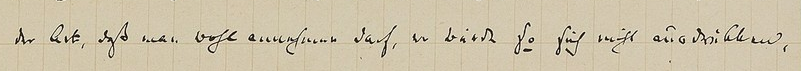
der Art, daß man wohl annehmen darf, er würde so sich nicht ausdrükken,
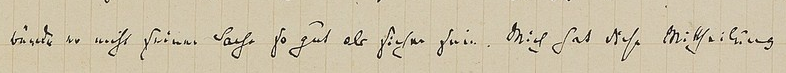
würde er nicht seiner Sache so gut als sicher sein. Mich hat diese Mittheilung
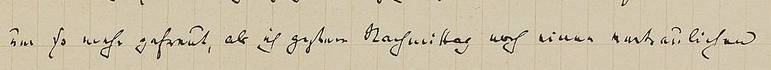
um so mehr gefreut, als ich gestern Nachmittag noch einen vertraulichen
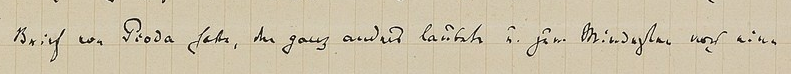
Brief von Pioda hatte, der ganz anders lautete u. zum Mindesten noch eine
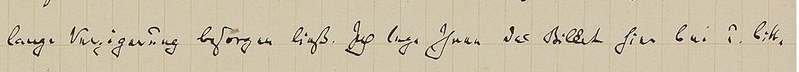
lange Verzögerung besorgen ließ. Ich lege Ihnen das Billet hier bei u. bitte
